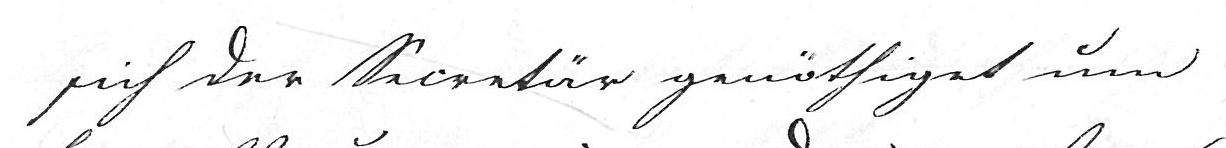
sich der Secretär genöthiget um
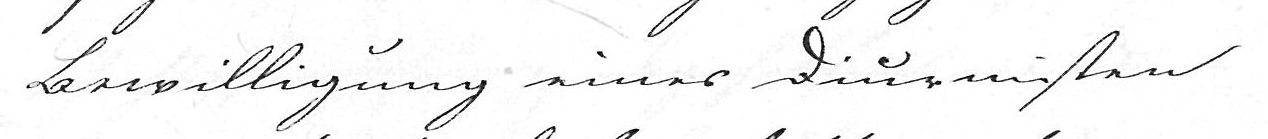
Bewilligung eines Diurnisten
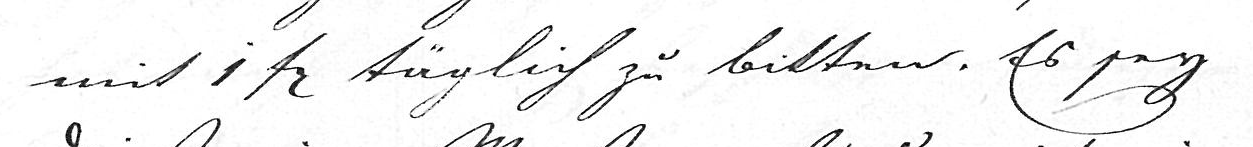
mit 1 fl täglich zu bitten. Es sey
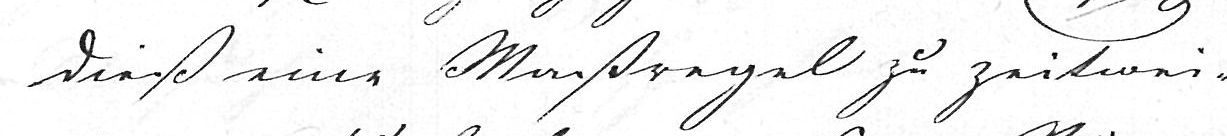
dieß eine Maßregel zu zeitwei-
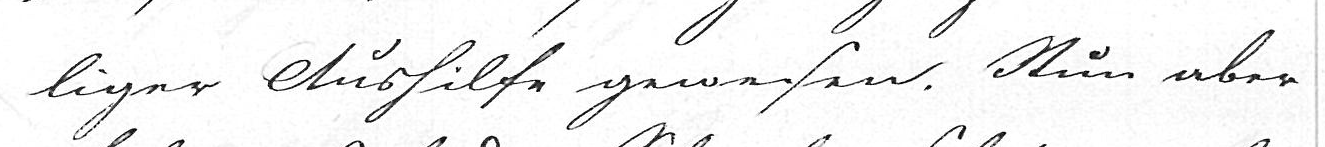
liger Aushilfe gewesen. Nun aber
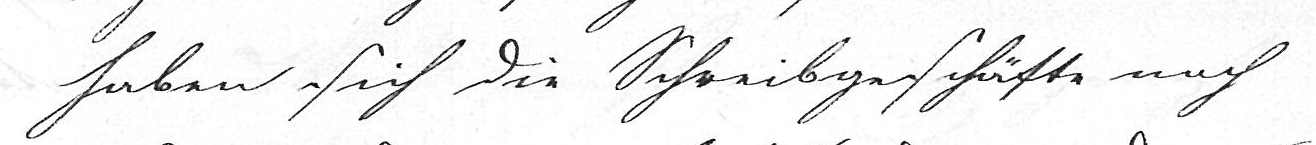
haben sich die Schreibgeschäfte noch
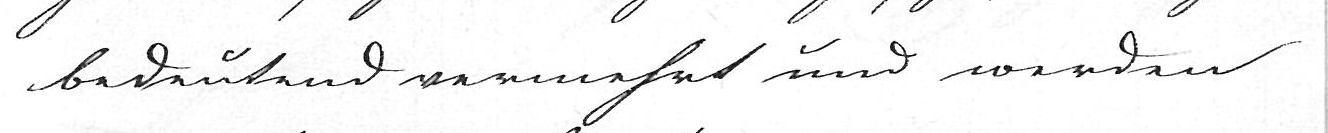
bedeutend vermehrt und werden
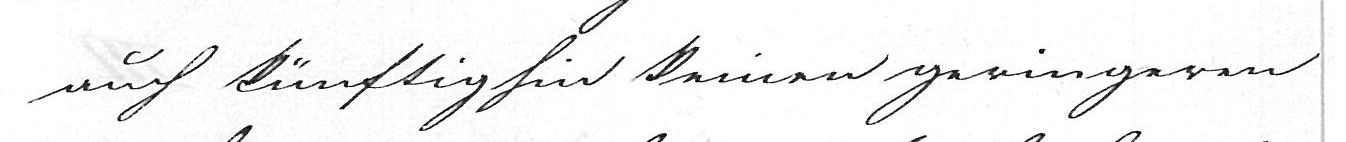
auch künftighin keinen geringeren
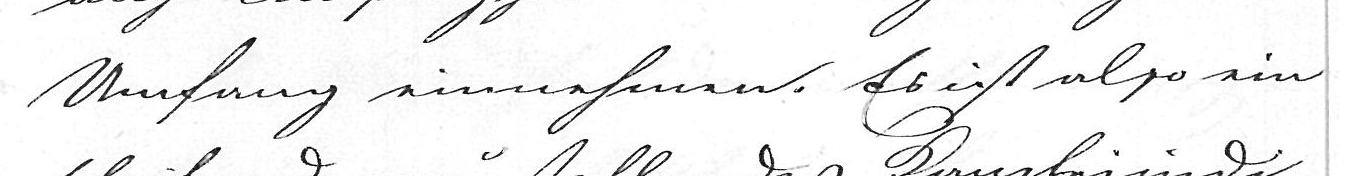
Umfang einnehmen. Es ist also ein
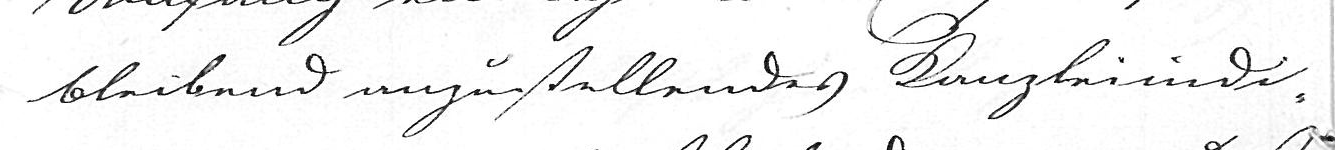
bleibend anzustellendes Knazleiindi-
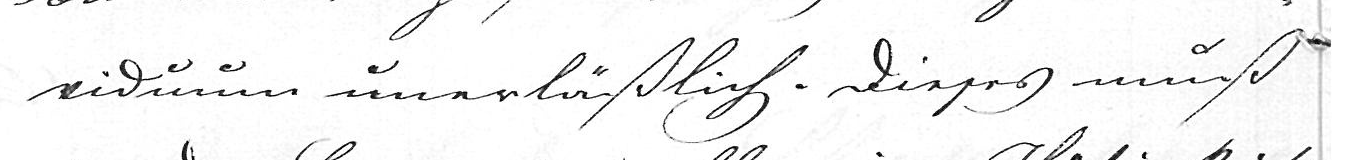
viduum unerläßlich. Dieses muß
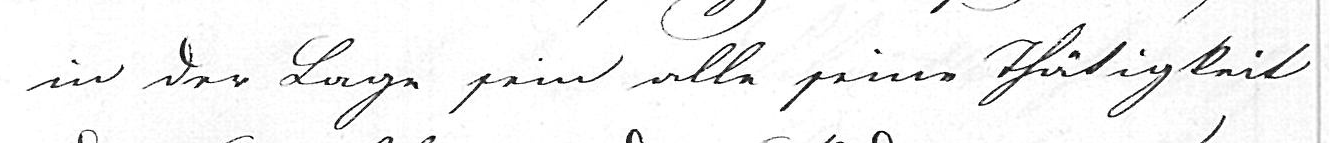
in der Lage sein alle seine Thätigkeit
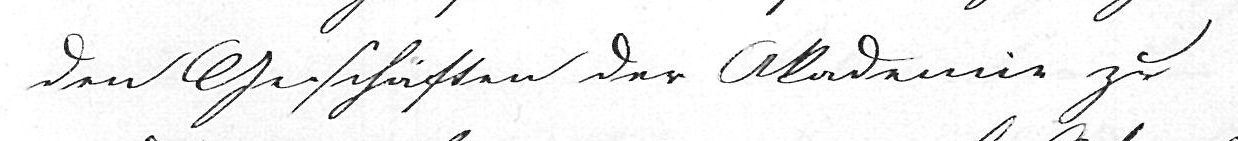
den Geschäften der Akademie zu
